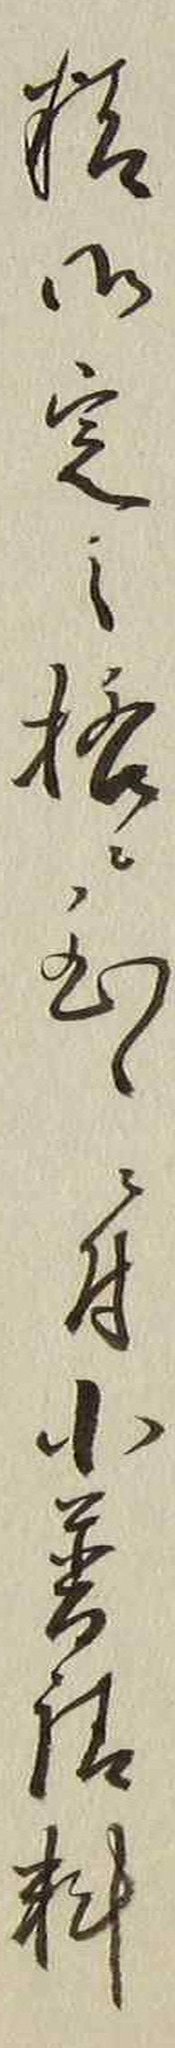精御定之格ニ至候ニ付小普請料
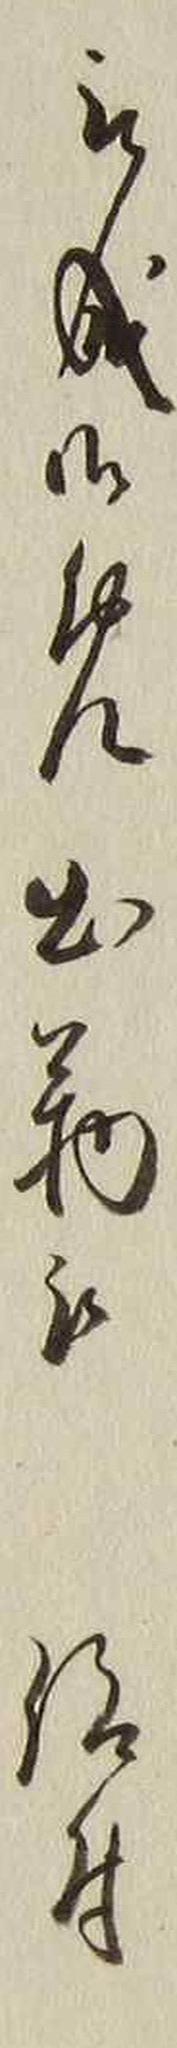被成御免出勤被仰付
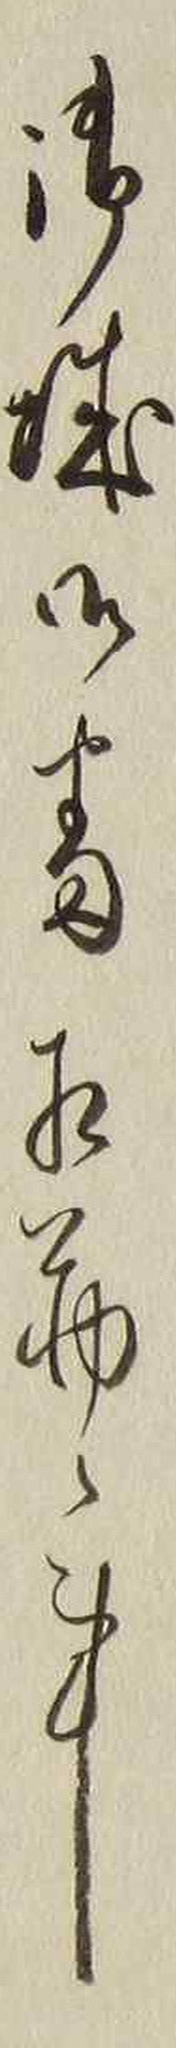御城御番相勤候事

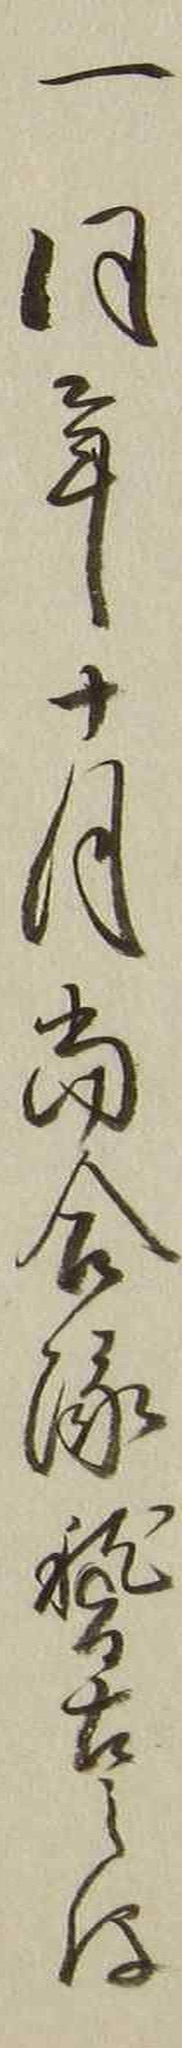一同年十月当合隊稽古之儀
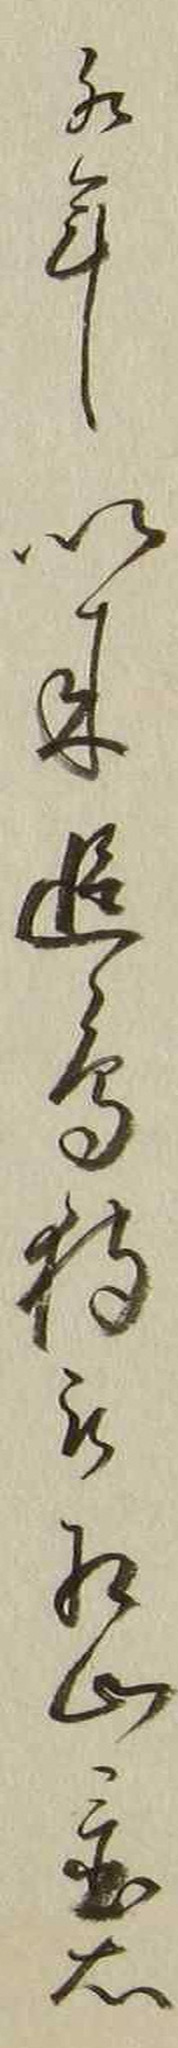卯年以来追鳥狩被相止置右
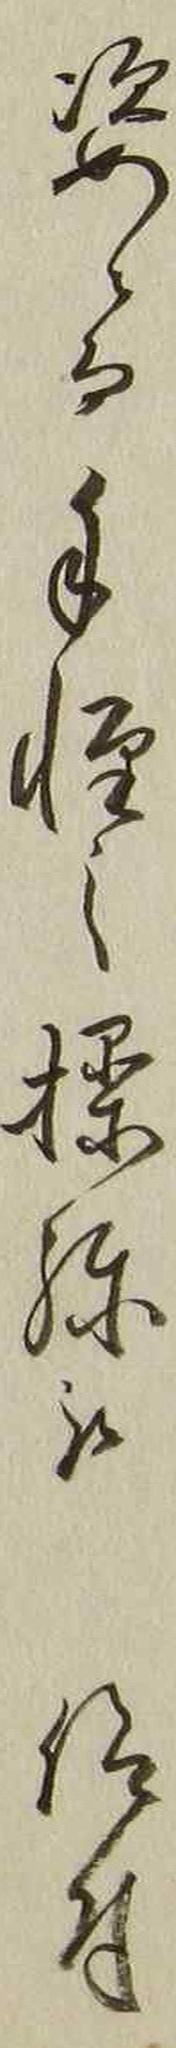姿ニ而手軽之操練被仰付
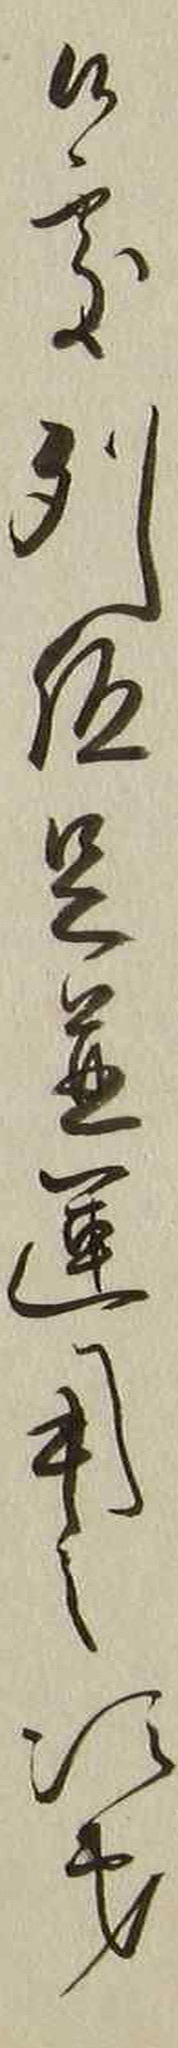候処列伍足並運用之次第
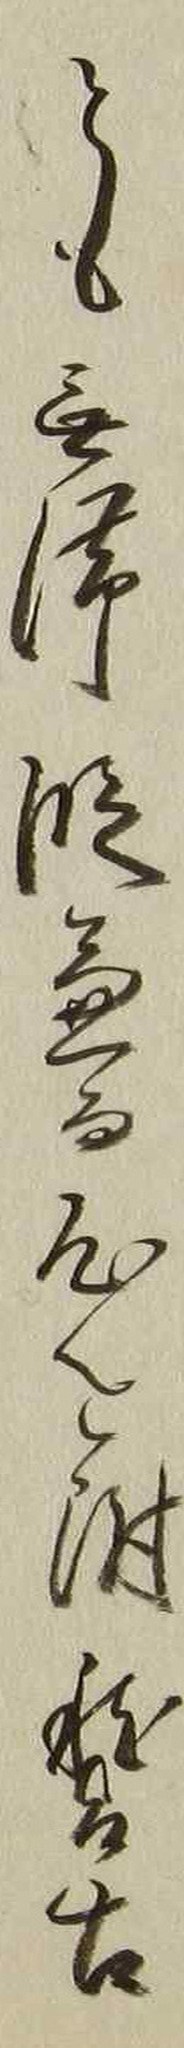とも無滞段兼而心を附稽古
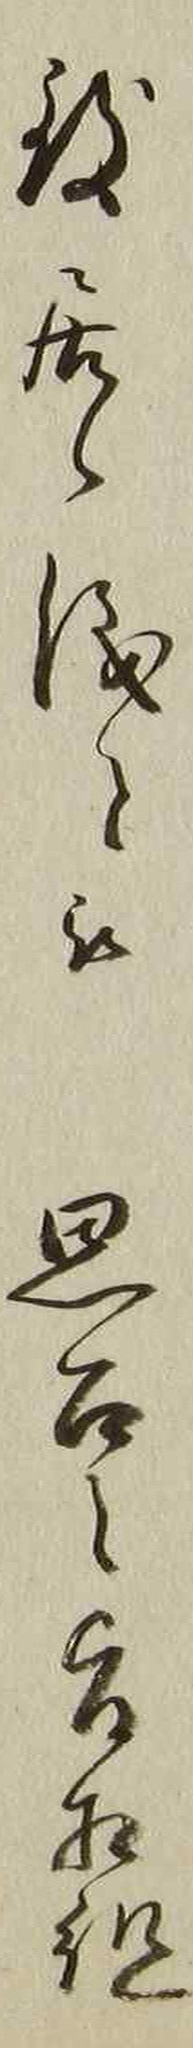致居候儀と被思召之旨相組
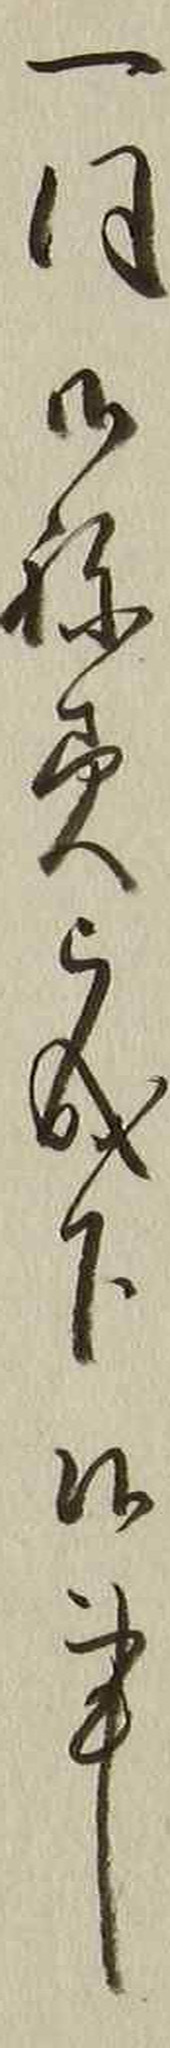一同御称美被成下候事
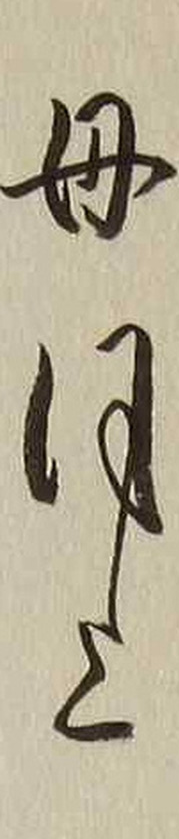母同上
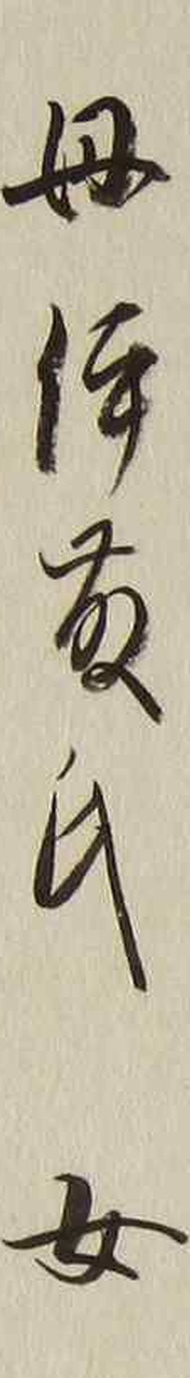母伊藤氏女
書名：諸士系譜　巻之18　い之部18
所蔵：会津若松市立会津図書館
